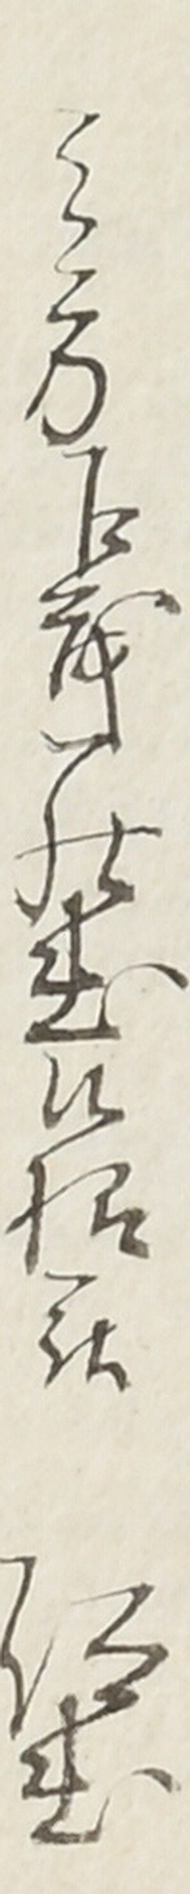之方江も罷出候様被仰出

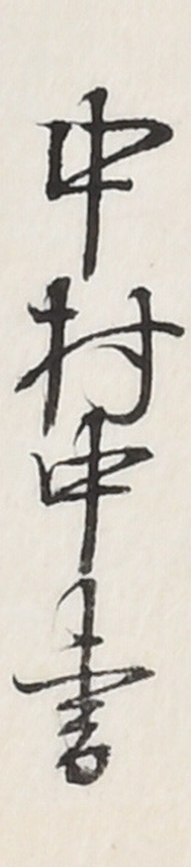中村中書
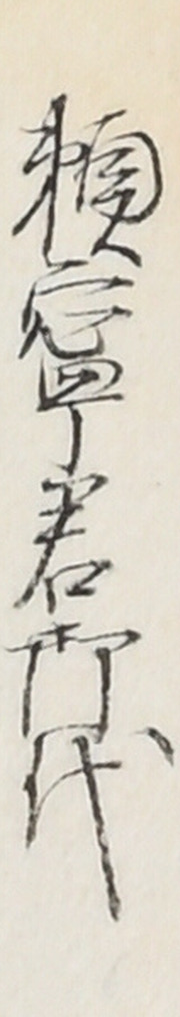頼寧君御代
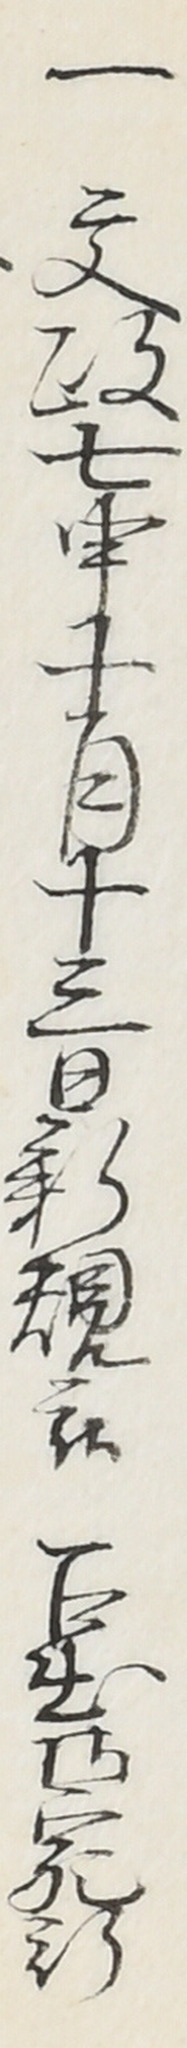一文政七申十月十三日新規被召出御宛行
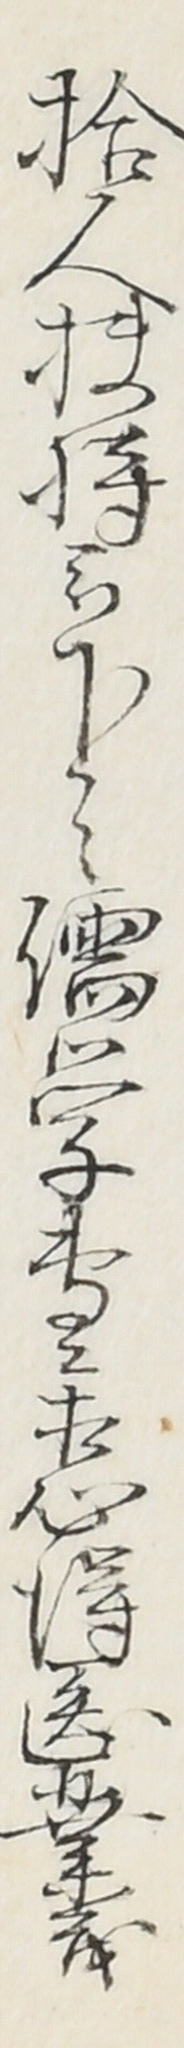拾人扶持被下之儒学専ニ相心得医業も
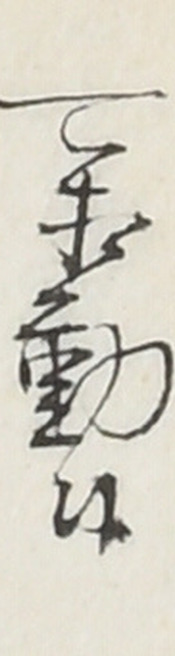可相勤候
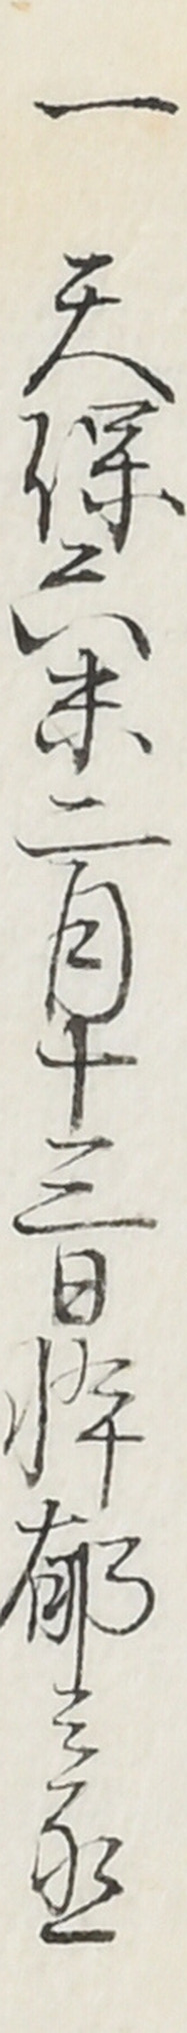一天保六未二月十三日伜郁之丞
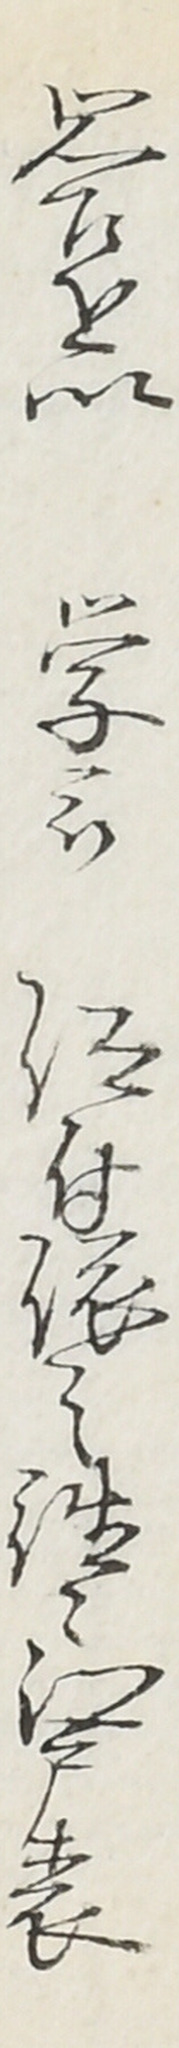思召を以学被仰付依之往々江戸表
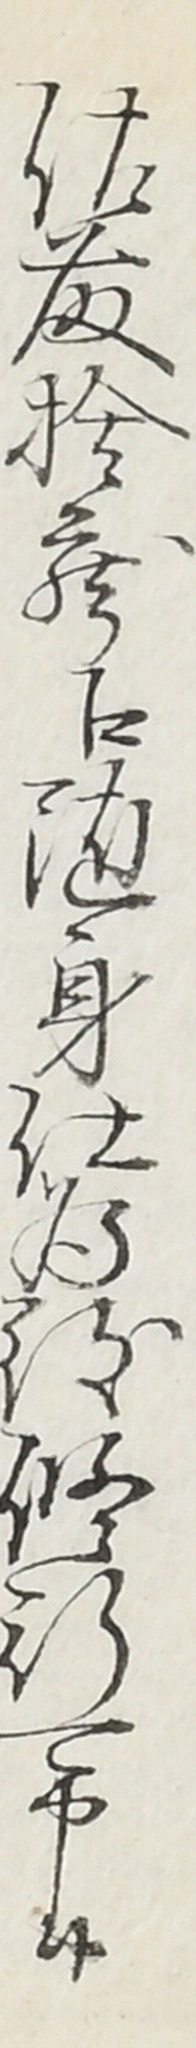佐藤捨蔵江随身仕為致修行可申候
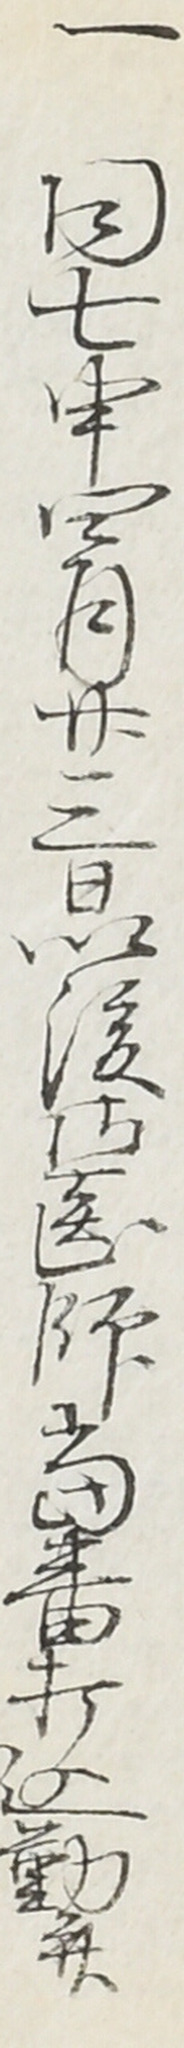一同七申四月廿三日以後御医師当番打込勤并
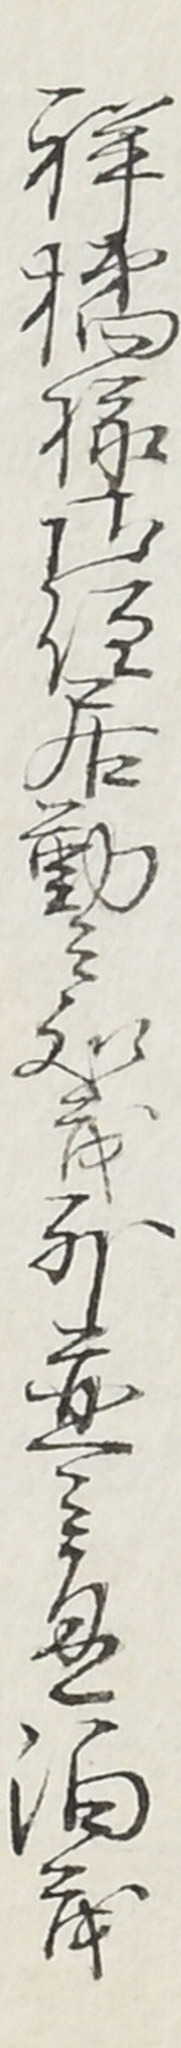祥橘様御住居勤之処も外並之通泊も
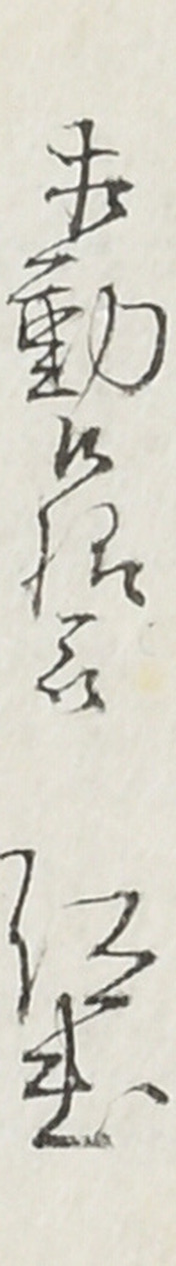相勤候様被仰出
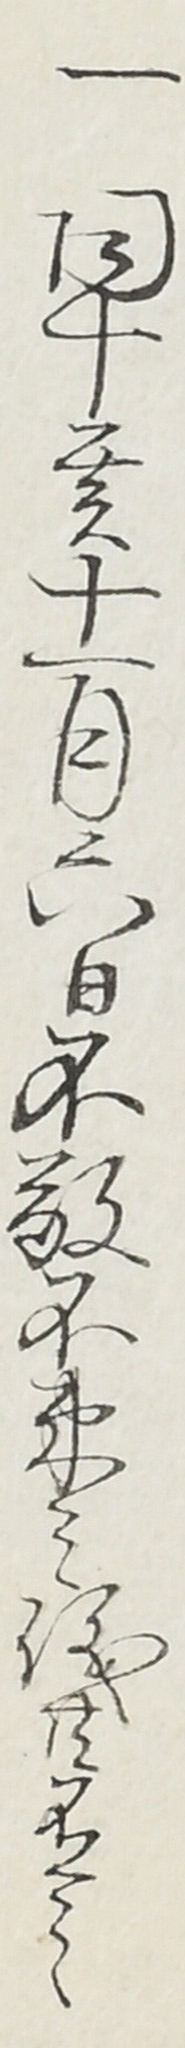一同十亥十一月六日不敬不束之儀共有之
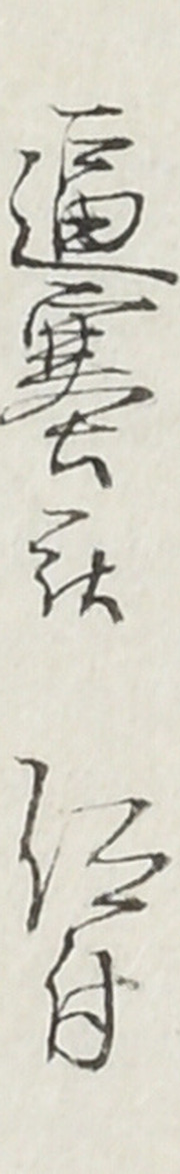逼塞被仰付
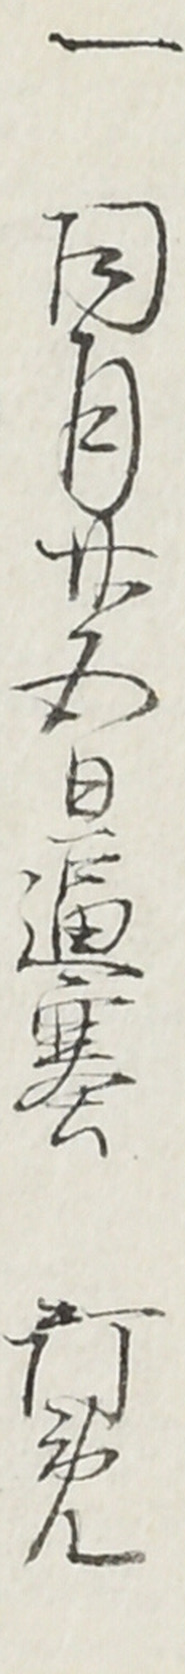一同月廿五日逼塞御免
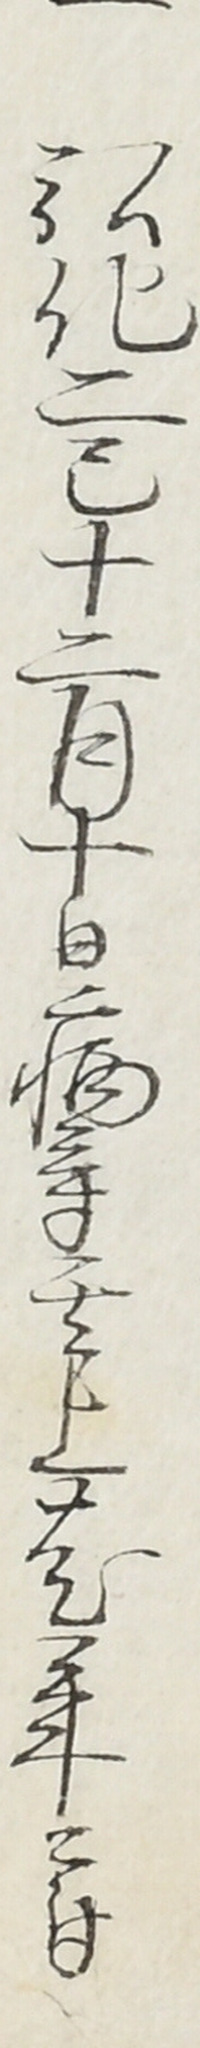一弘化二巳十二月十日病気其上老年ニ付
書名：給人諸士勤仕録（七）
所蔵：伊那市立高遠町図書館・合同会社AMANE
